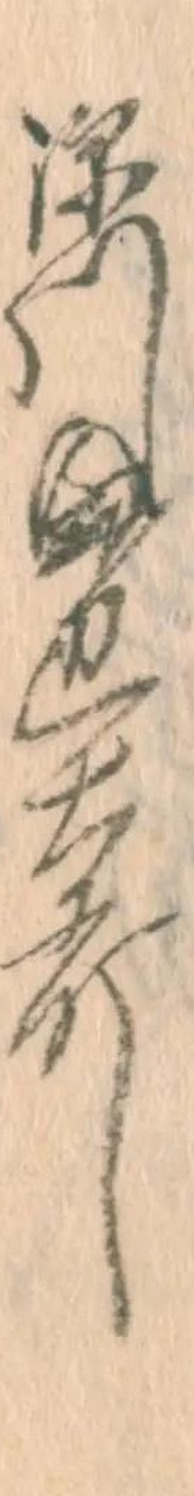深川海辺大工町
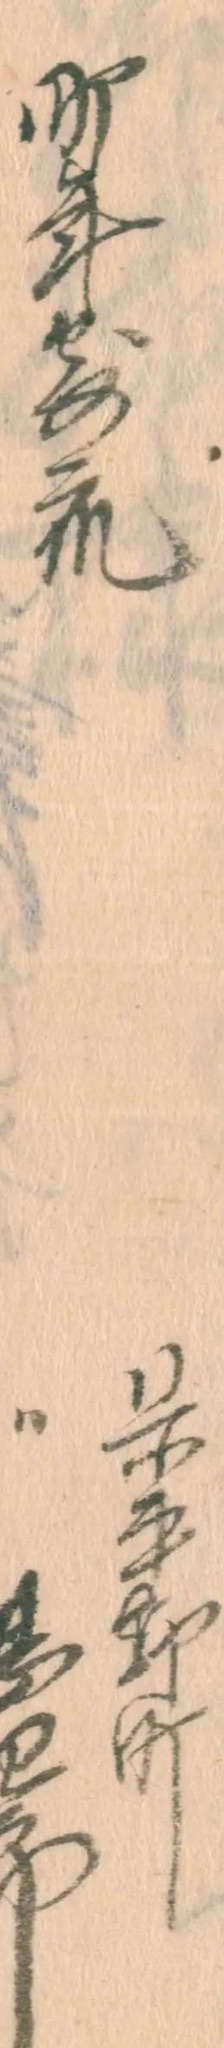町年寄衆同所平野町
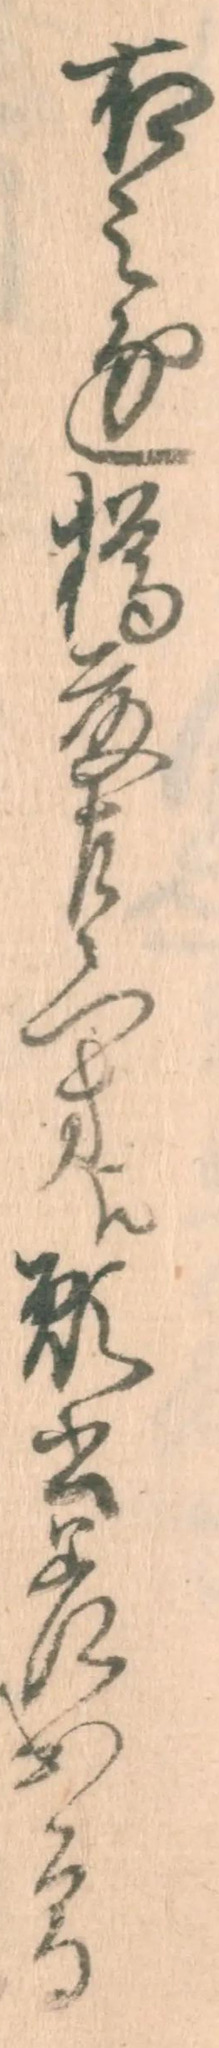右之通樽藤左衛門方え願書差出候間
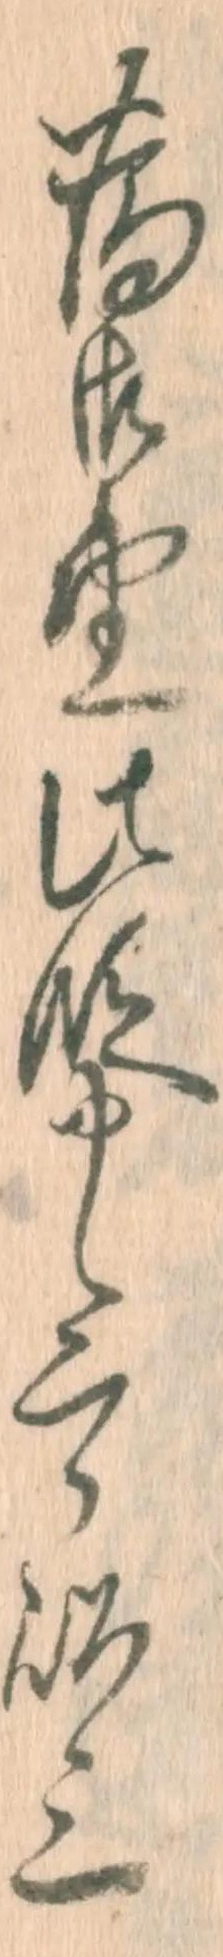為御届此段申上候以上
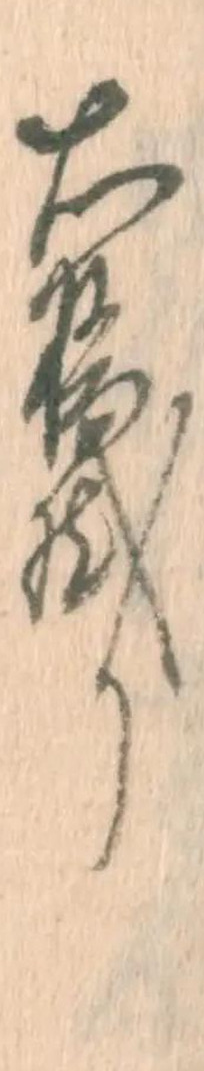右橋掛り
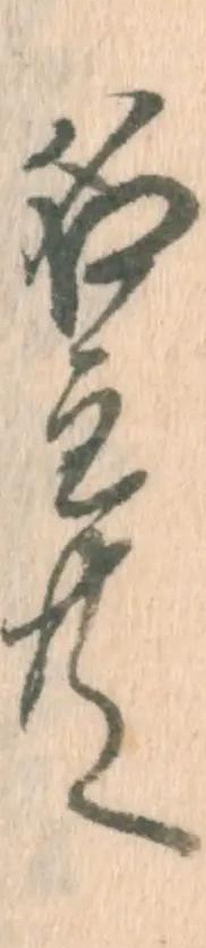名主共
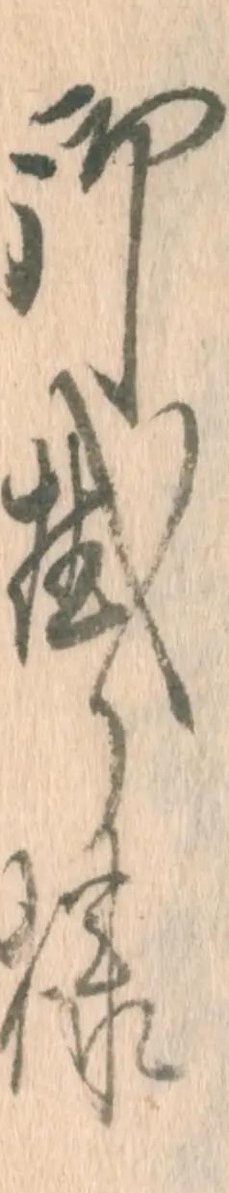御掛り様

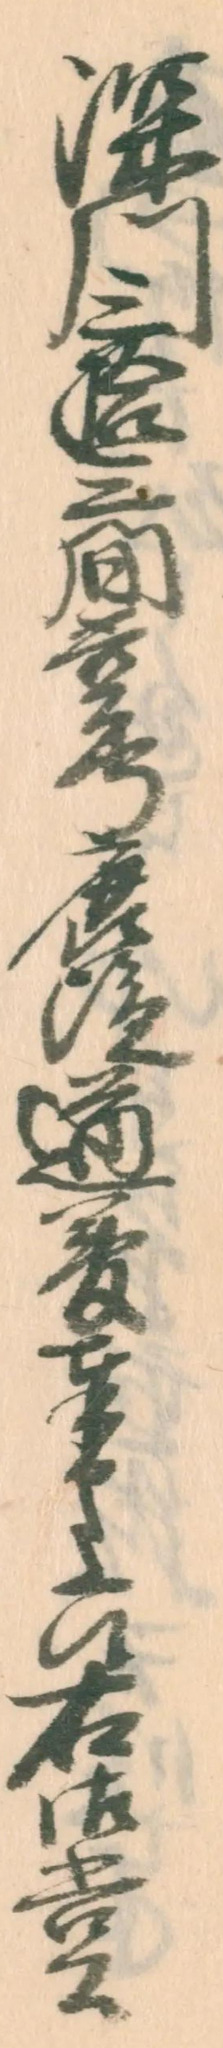一深川三拾三間堂守鹿塩道菅奉申上候右御堂
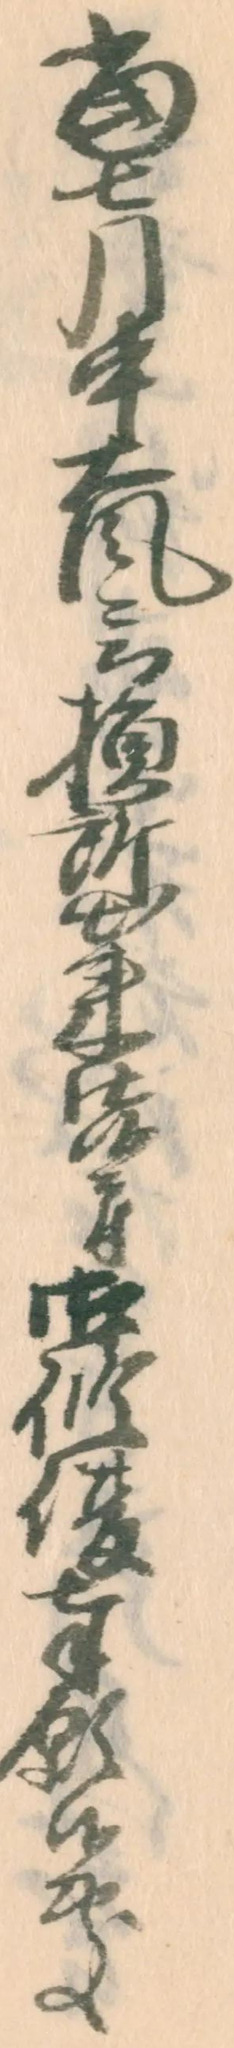当月七月中大風ニ而損所出来仕候ニ付御修復奉願候処
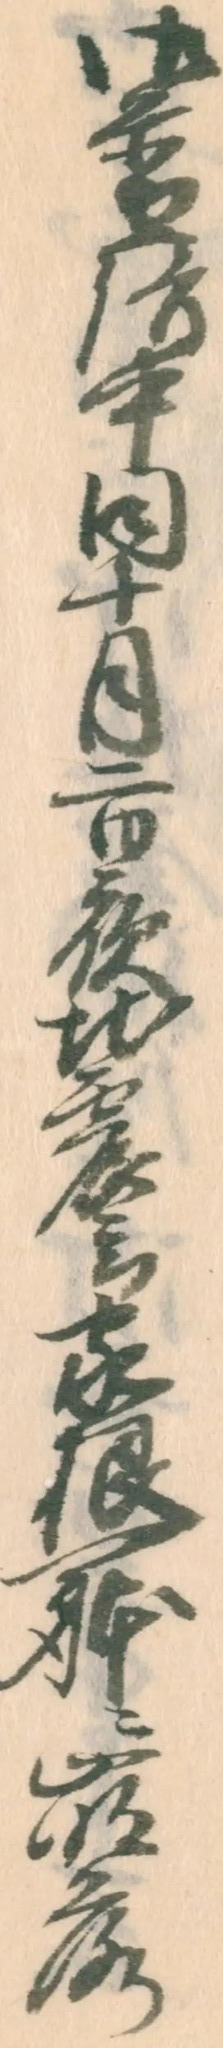御普請中同十月二日夜地震ニ而家根一躰ニ崩落
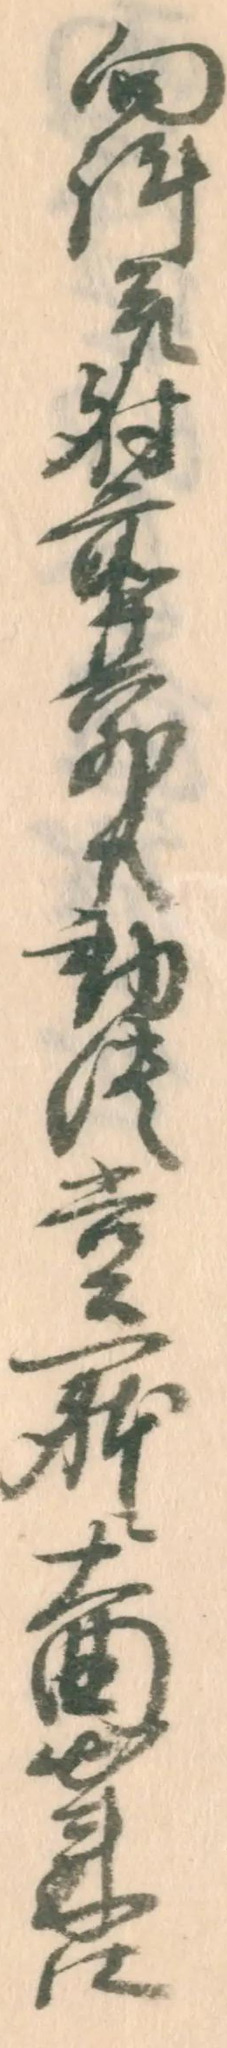向拝并射所其外共動潰堂一躰ニ大曲出来仕
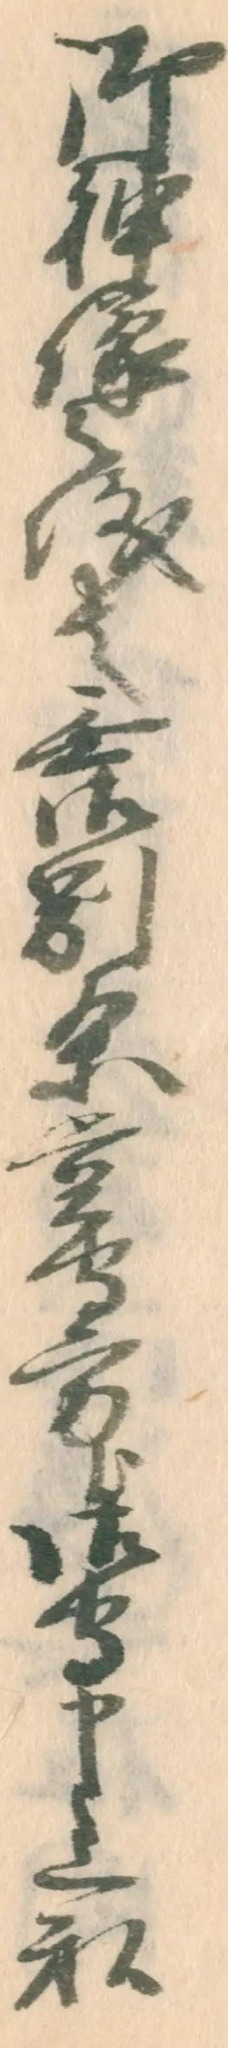御神像之儀は無御別条堂守方え御守申上私

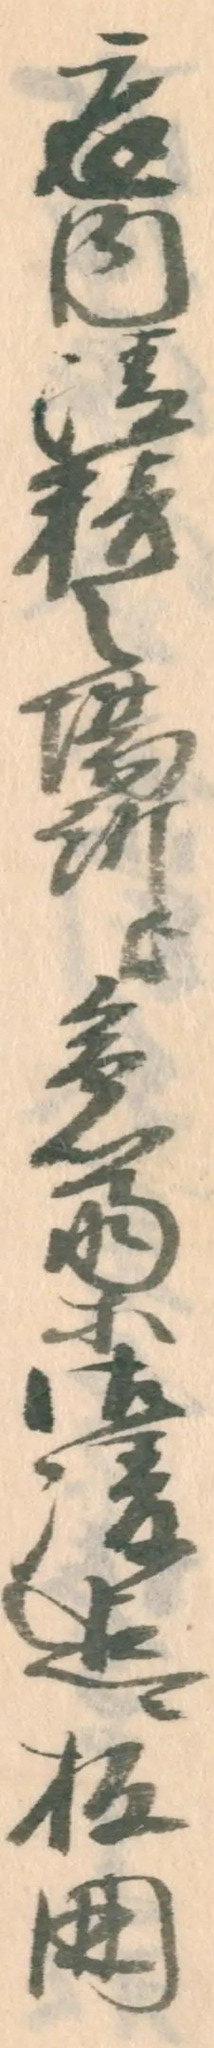庭内清精之場所え急雨等御凌迄板囲
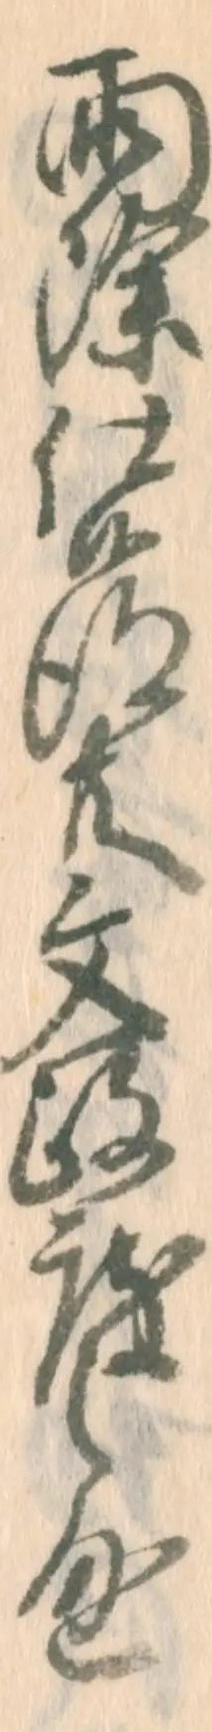雨除仕候得共文政度之通
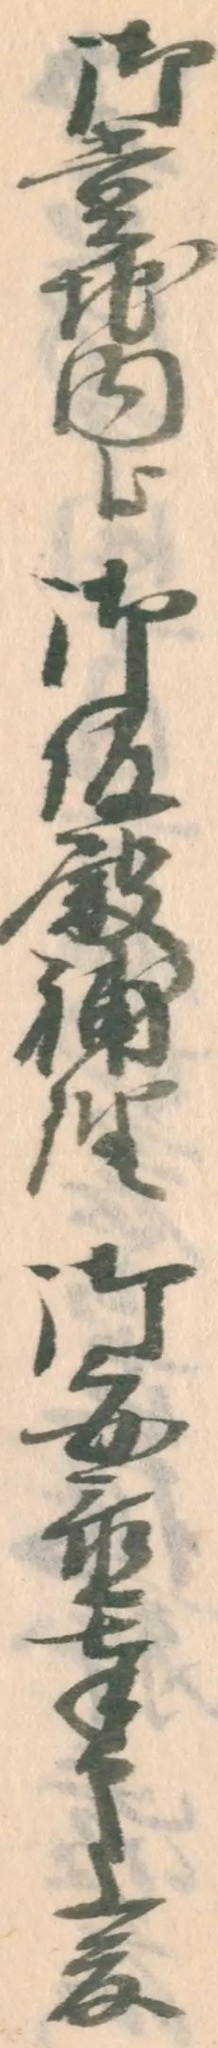御堂地内え御仮殿補理御安置奉申上度
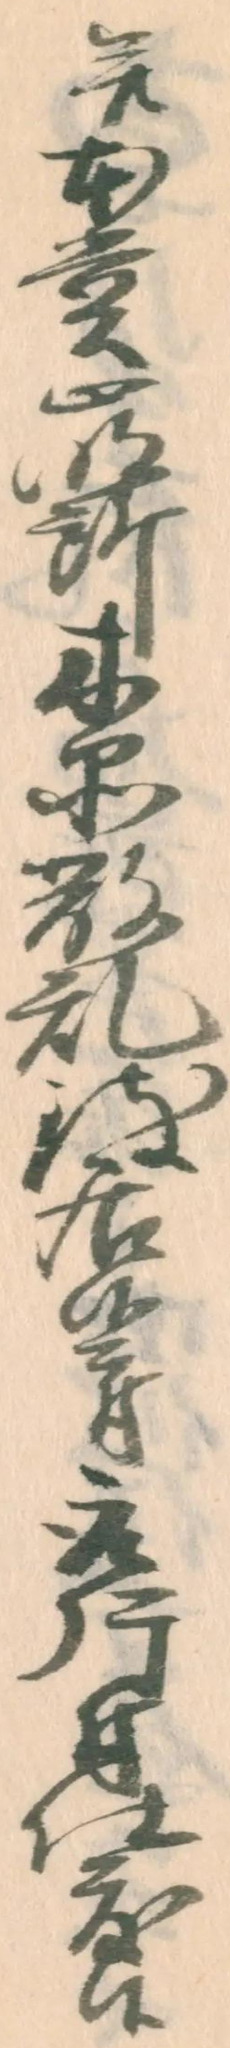并本堂崩所木品散乱致居候ニ付取片付仕度候
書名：地震災書留 2巻. [1] 内表紙に「地震災書留　安政二卯年　但本所深川御用屋敷地代免除調」とあり
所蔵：国立国会図書館 National Diet Library, JAPAN
